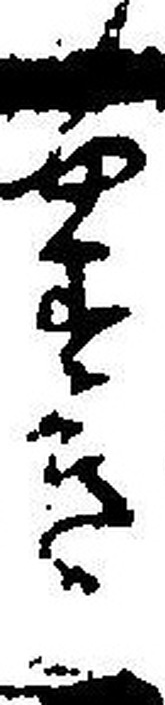やすき
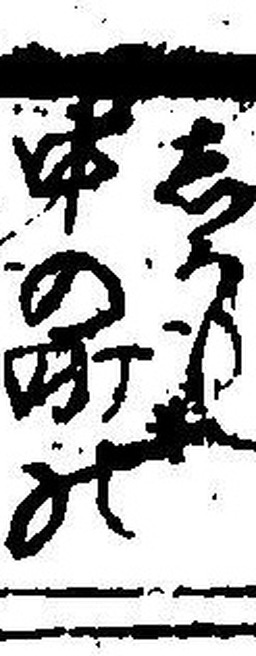中の町の
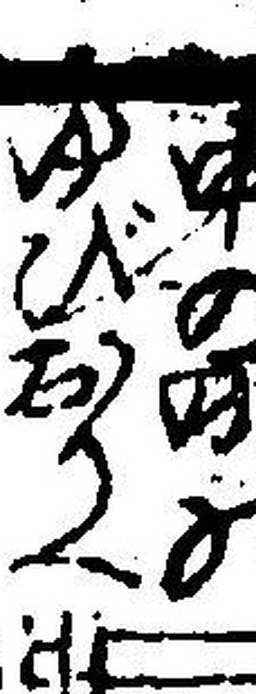ゆびおりへ
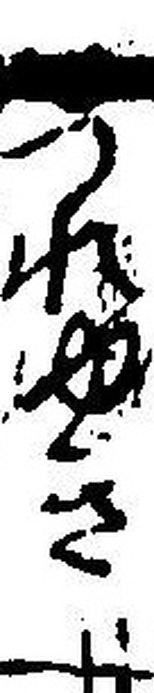つれゆき
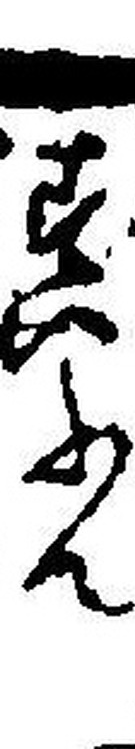ずいふん
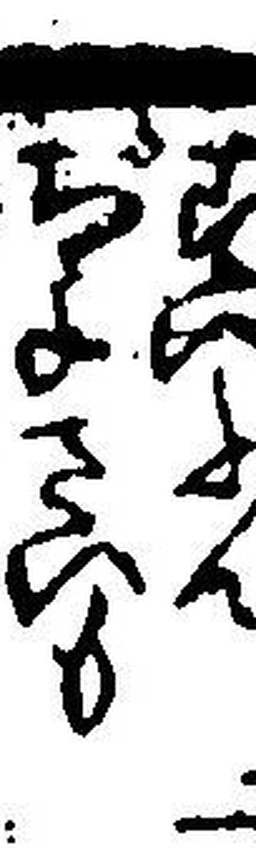じよさいも
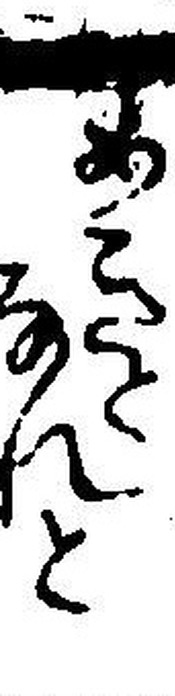なれと
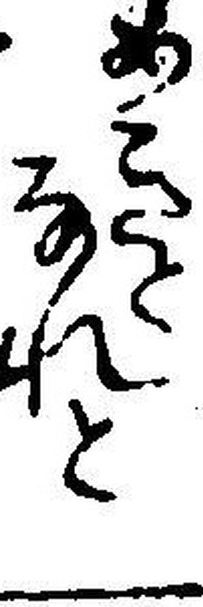なれと
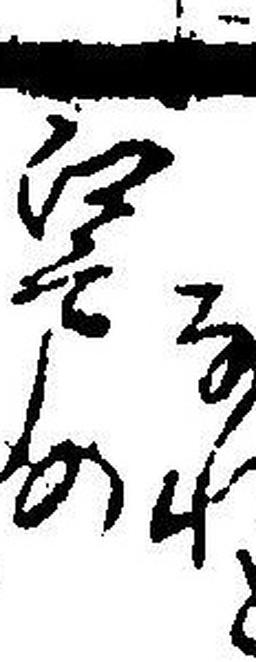江戸の
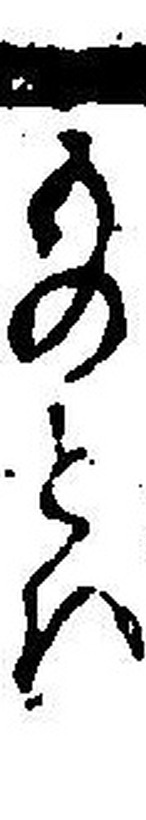ものとは
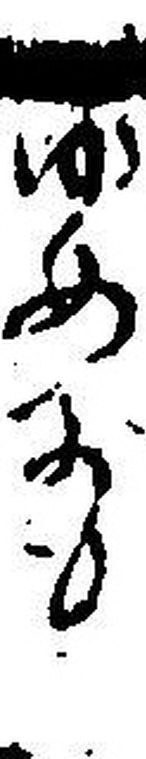ゆめにも
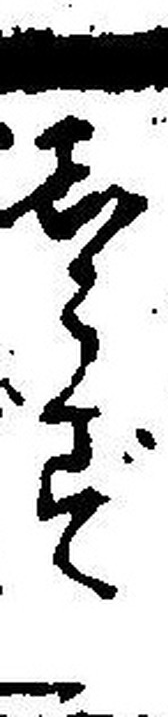しらず
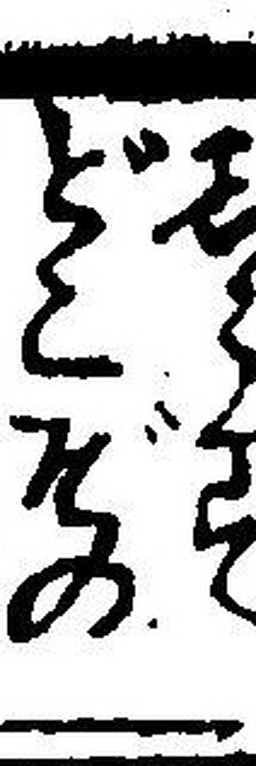どこぞの
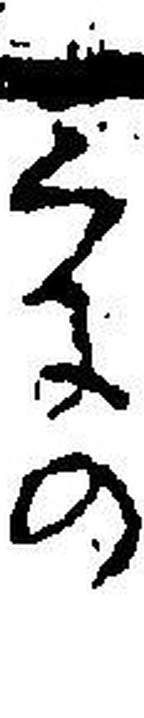くにの
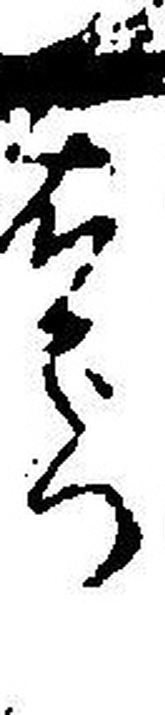はらつ
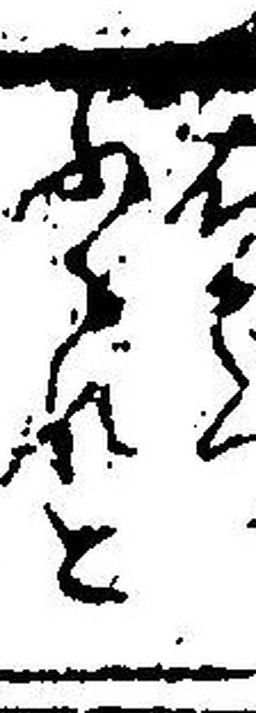ふくれと
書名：間違狐之女郎買 / 市場通笑作
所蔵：東京大学総合図書館 General Library in the University of Tokyo, JAPAN
